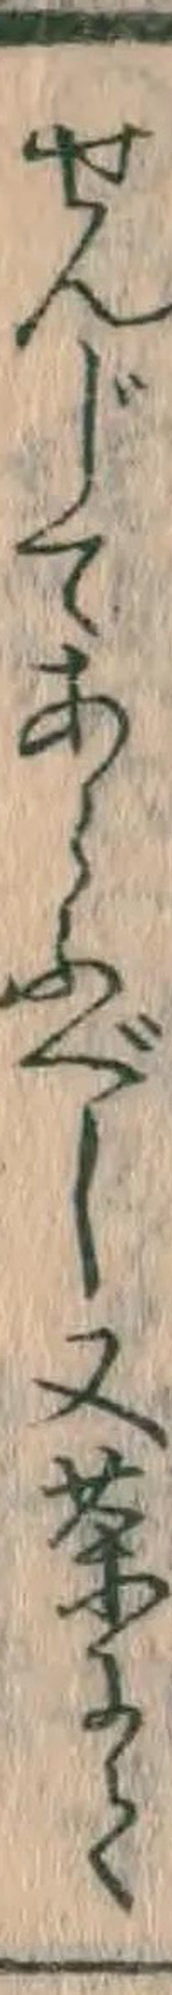せんじてあらふべし又茶にて
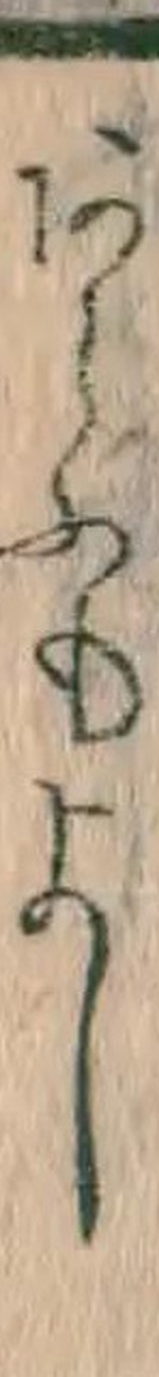あらふもよし
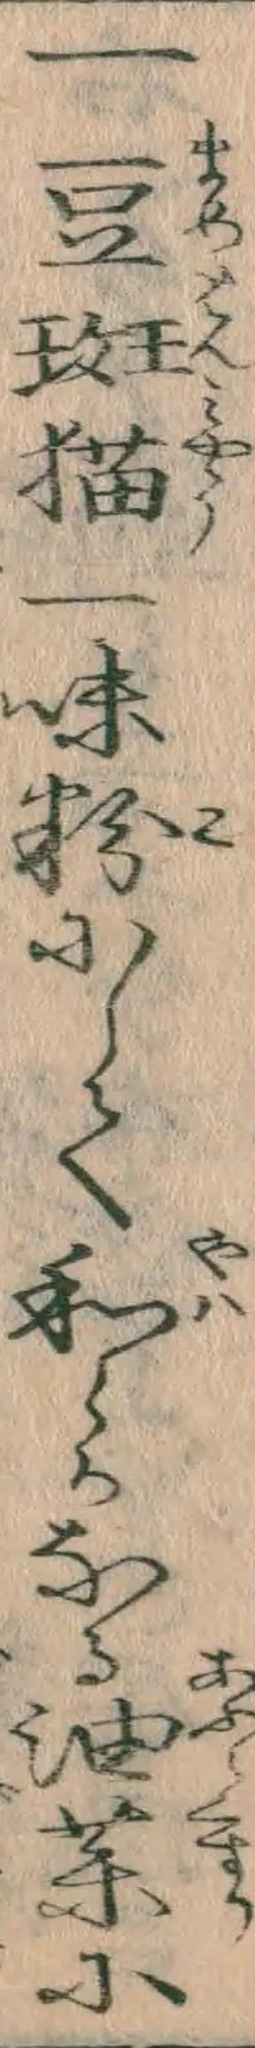一豆斑猫一味粉にして和らかなる油薬に
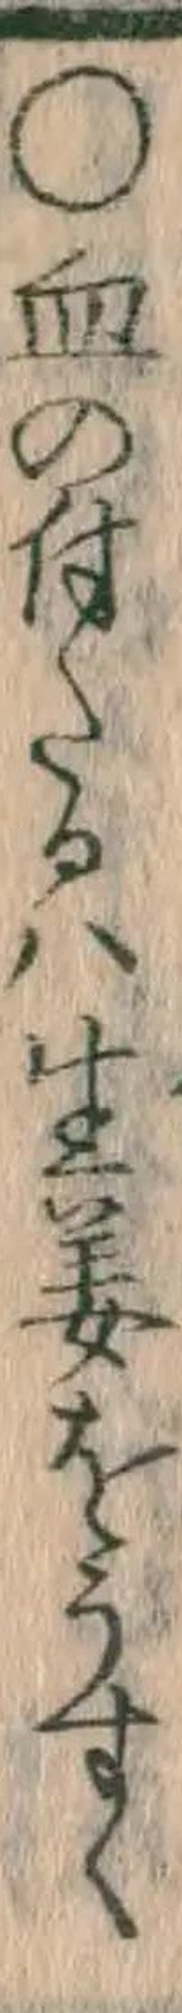○血の付たるは生姜をうすく
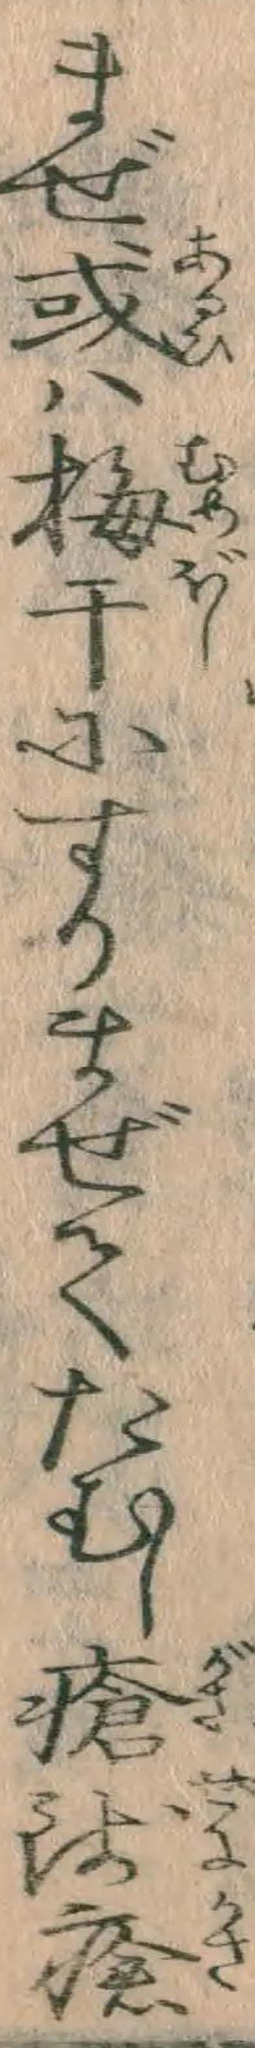まぜ或は梅干にすりまぜてたむし瘡銭瘡
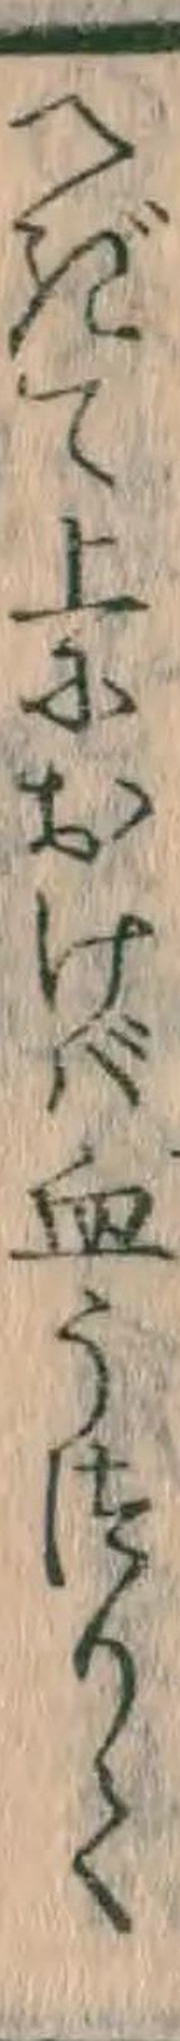へぎて上におけば血うつりて
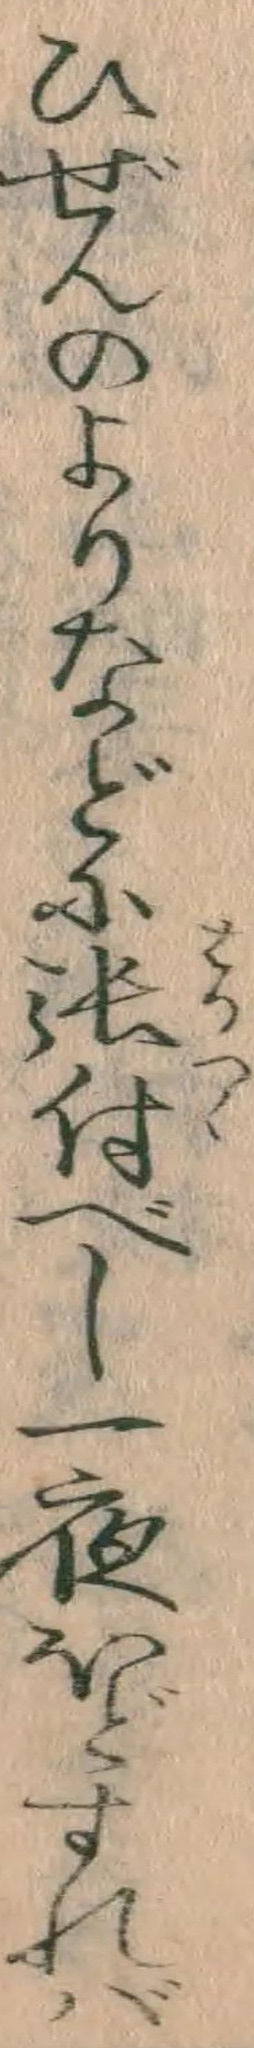ひぜんのよりなどに張付べし一夜ほどすれば
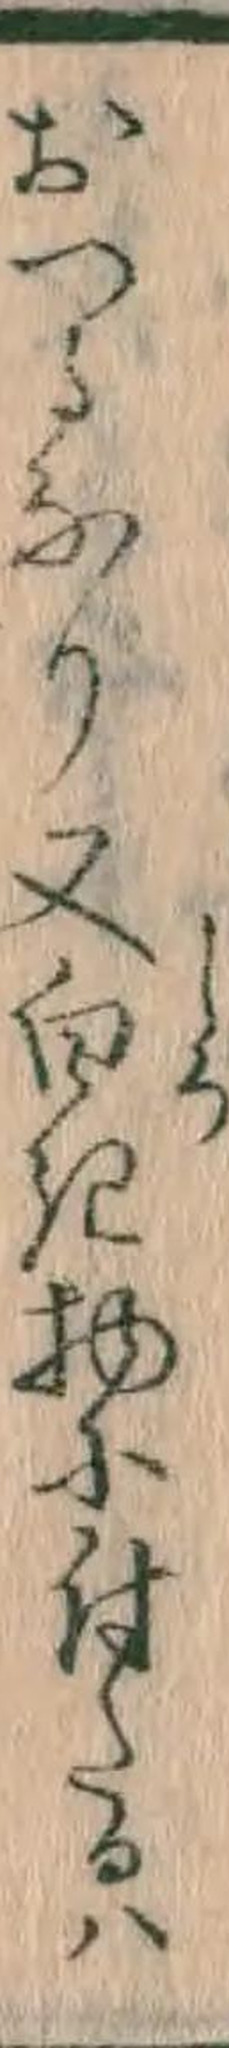おつるなり又白き物に付たるは
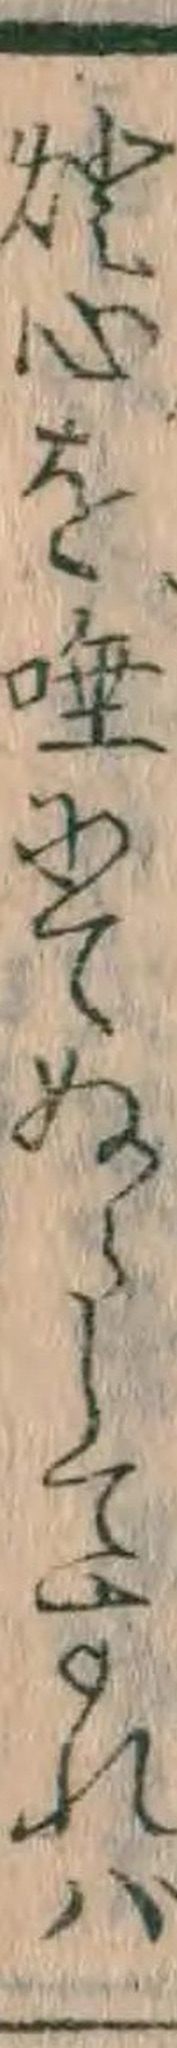燈心を唾にてぬらしてすれば
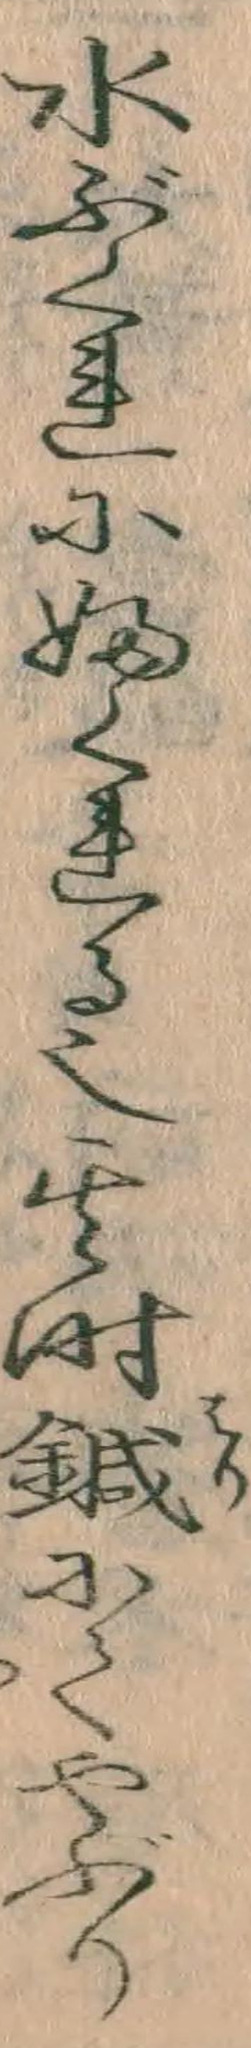水ぶくれにふくれる也其時鍼にてやぶり
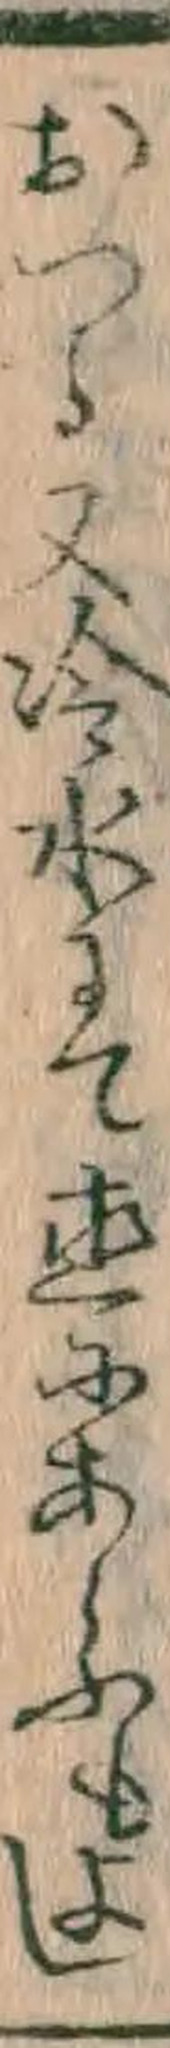おつる又冷水にて直にあらふもよし
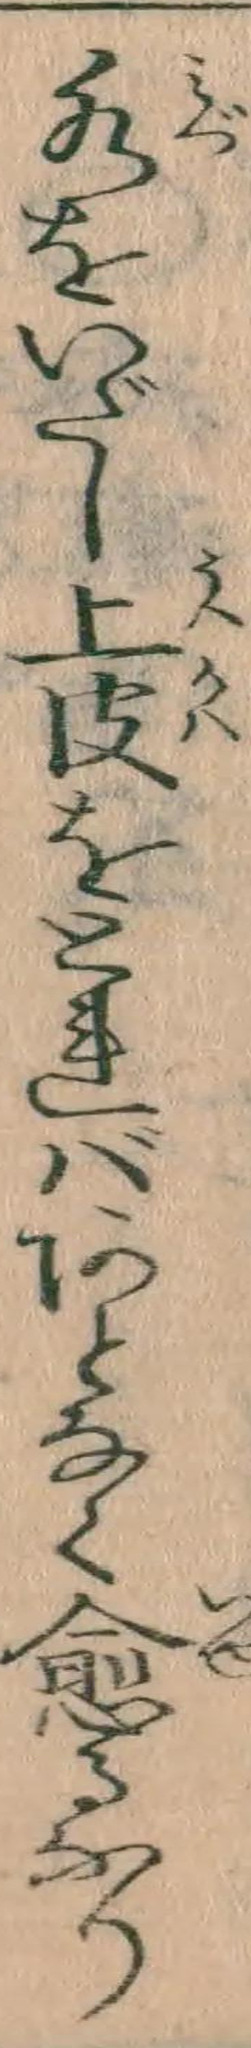水をいだし上皮をとればあとなく愈るなり
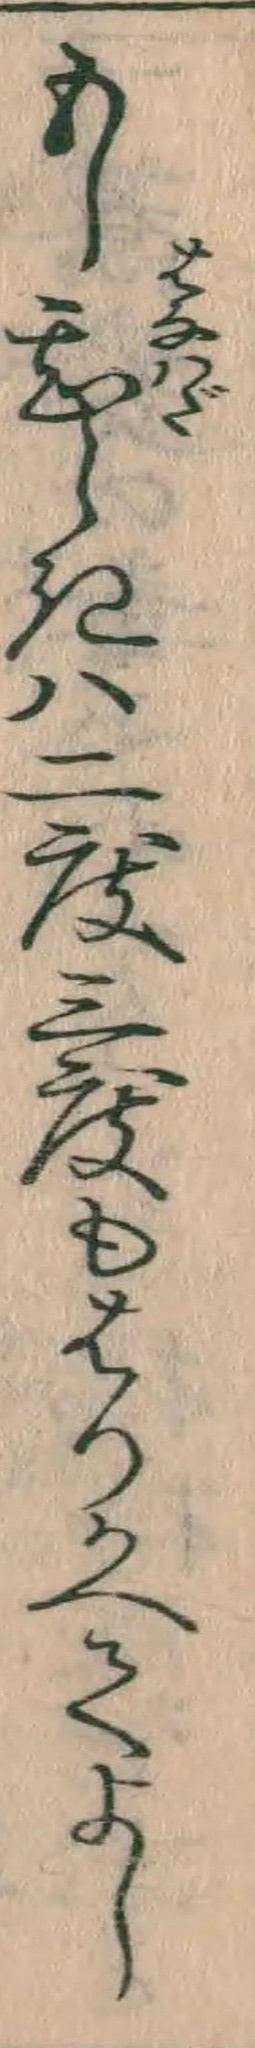もし甚しきは二度三度もはりかへてよし
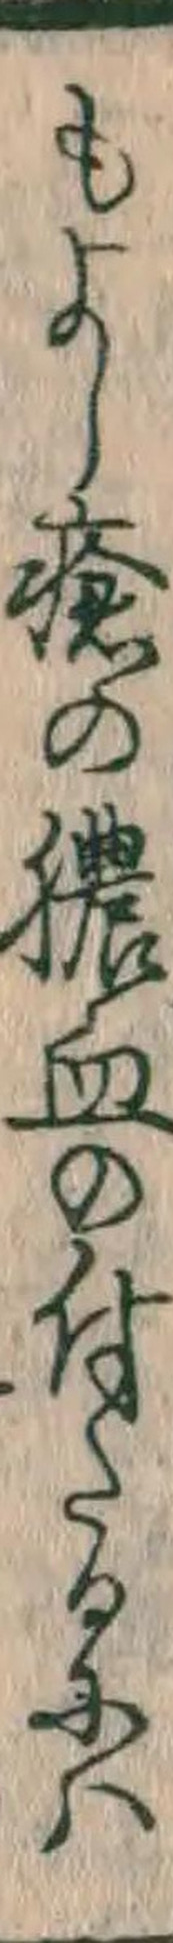もよし瘡の膿血の付たるには
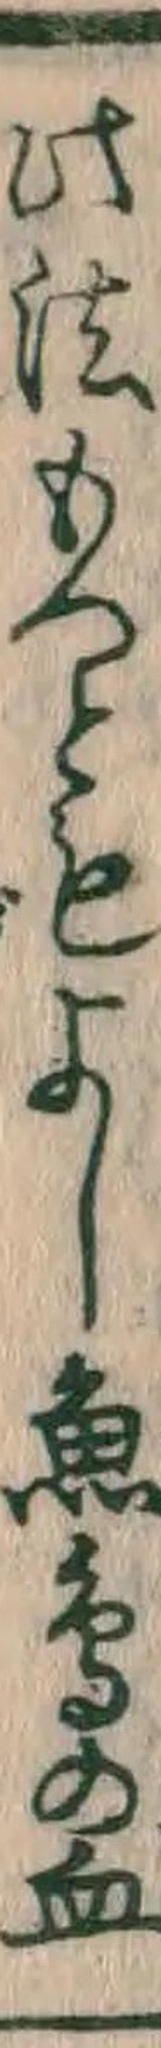此法もつともよし魚鳥の血
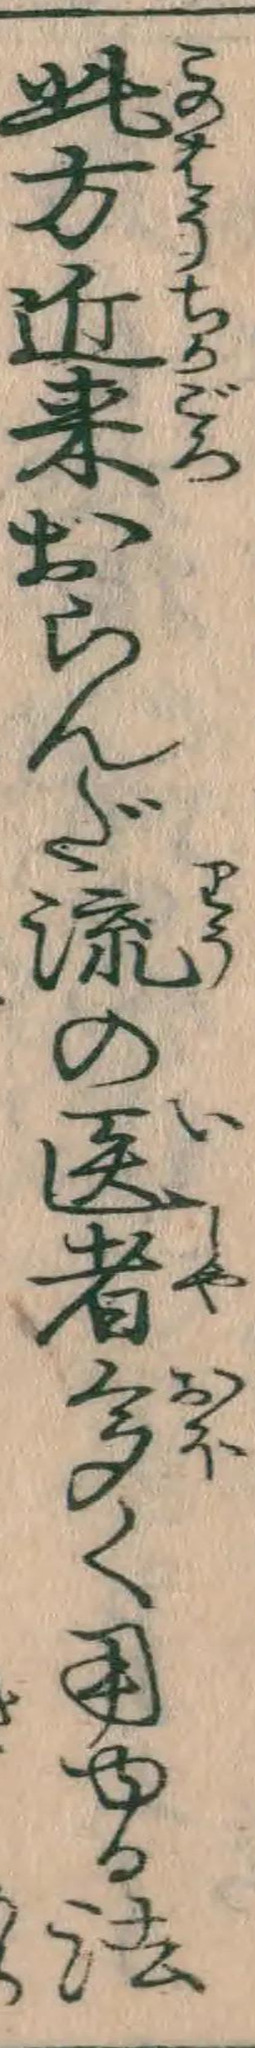此方近来おらんだ流の医者多く用ゆる法
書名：広益秘事大全 3巻. [3]
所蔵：国立国会図書館 National Diet Library, JAPAN
